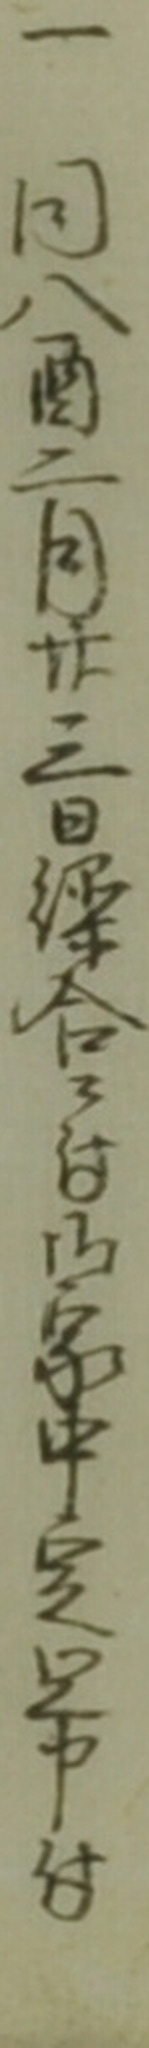一同八酉二月廿三日繰合ニ付御家中定廻申付
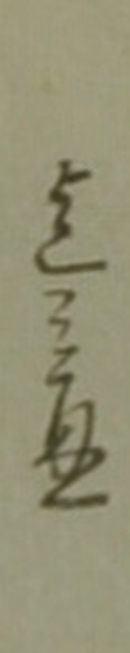迄之通
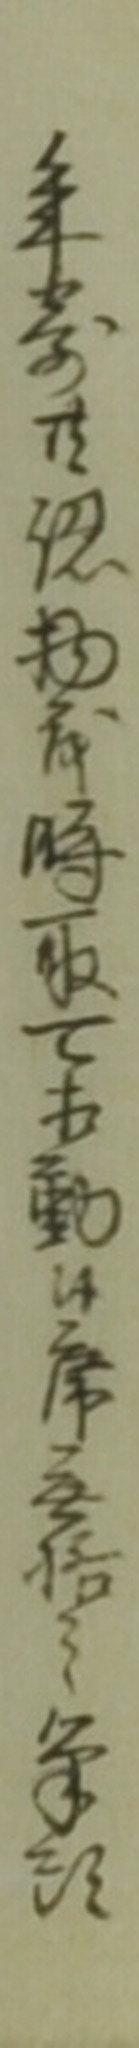年寄共認物茂時取可相勤候席無格之筆頭
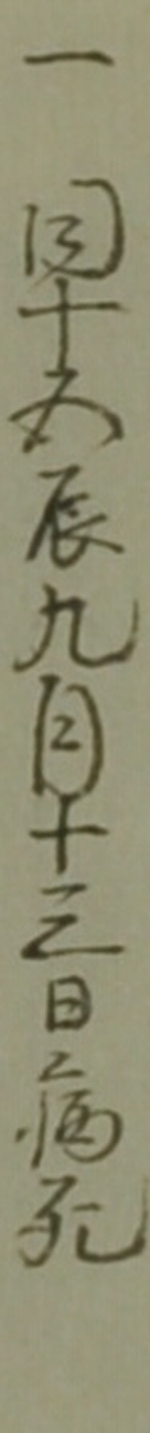一同十五辰九月十三日病死
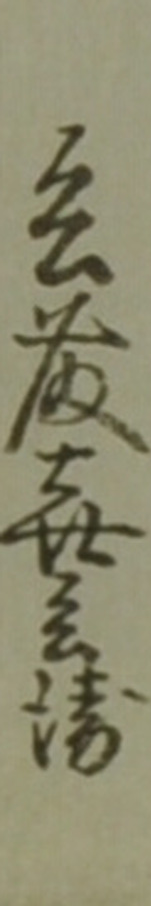兵藤喜兵衛
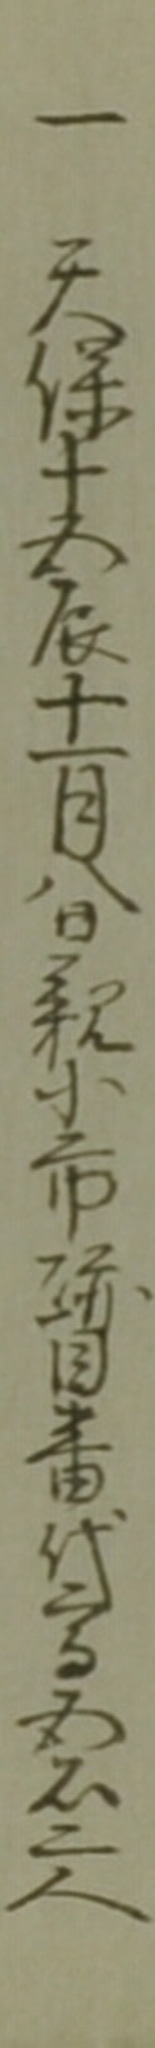一天保十五辰十一月八日親小市跡目番代高五石二人
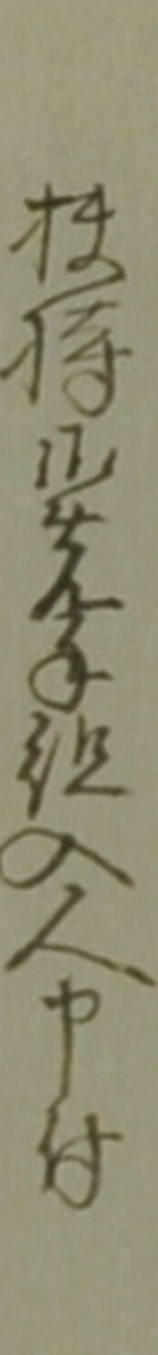扶持御先手組入人申付
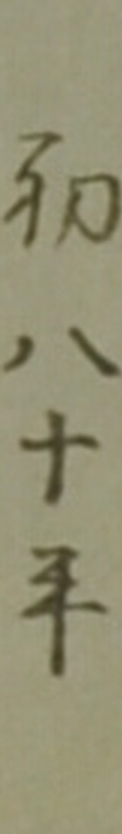初八十平

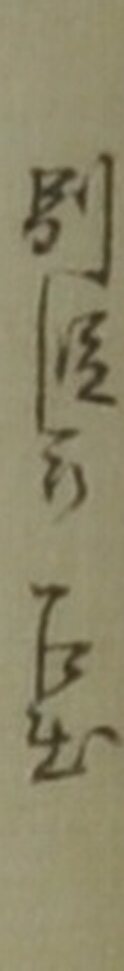別段被召出
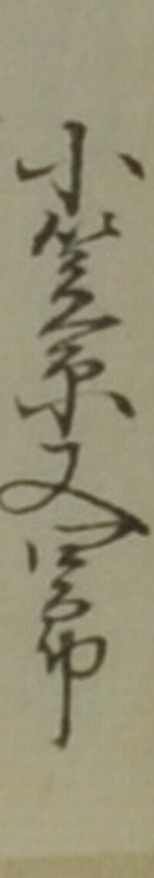小笠原又四郎

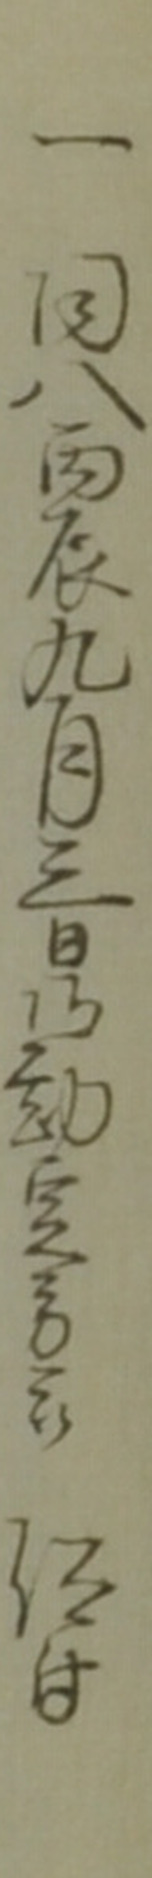一同八丙辰九月三日御勘定方被仰付
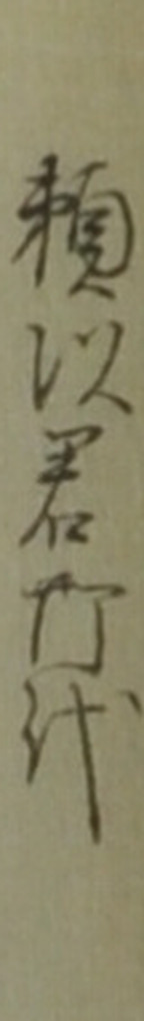頼以君御代
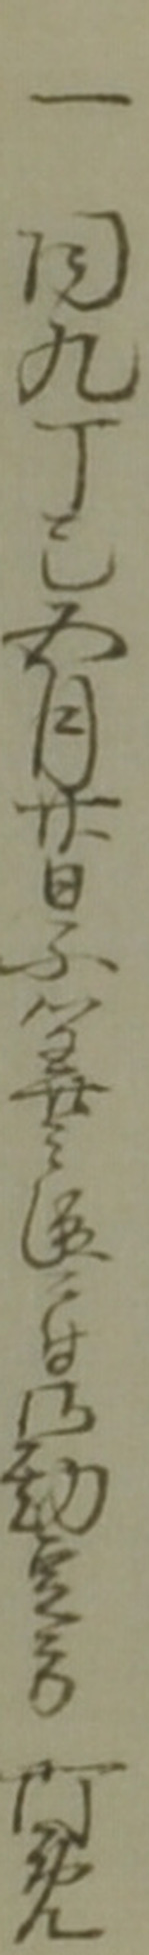一同九丁巳五月廿日不算之趣ニ付御勘定方御免
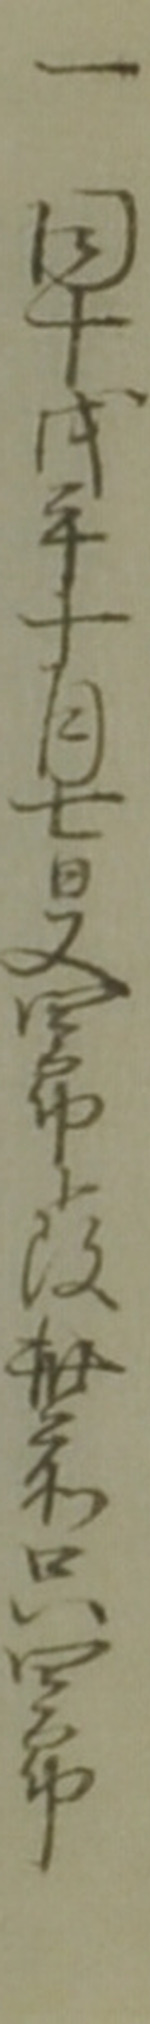一同十戊午十月七日又四郎ト改此前只四郎
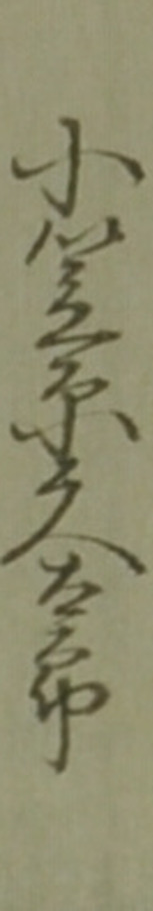小笠原久太郎

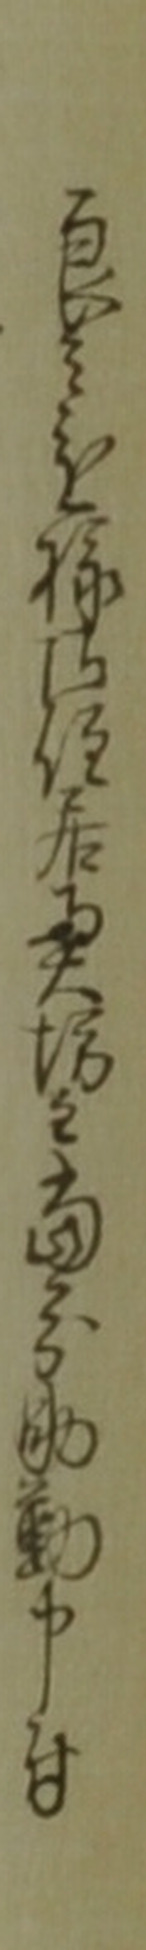良之進様御住居奥坊主当分助勤申付
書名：無足諸士勤仕録（九）
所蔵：伊那市立高遠町図書館・合同会社AMANE
